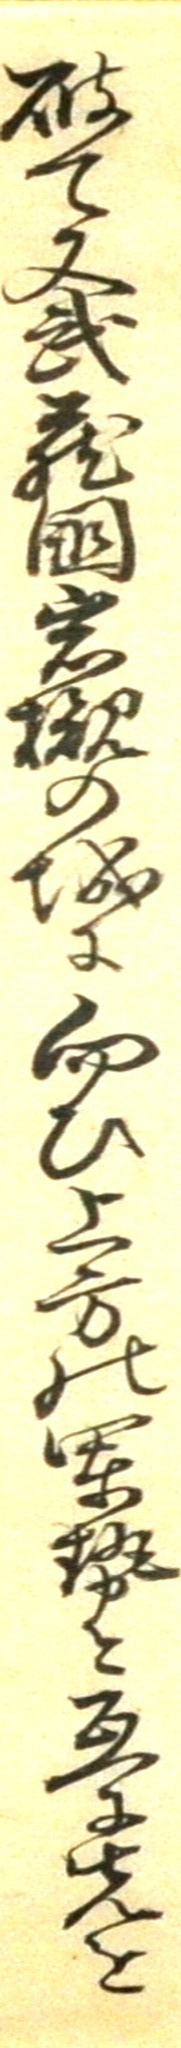破て又武蔵国岩槻の城に向ひ上方の軍勢と互に先を
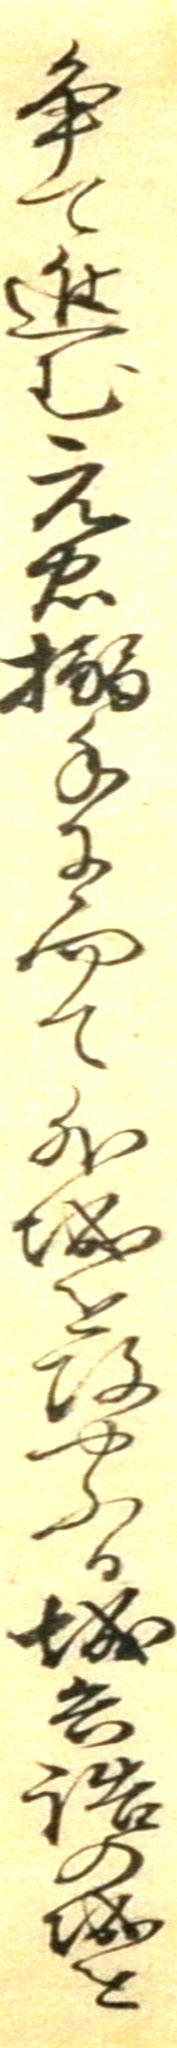争て進む元忠搦手に向て外城を攻やふる城兵詰の城を
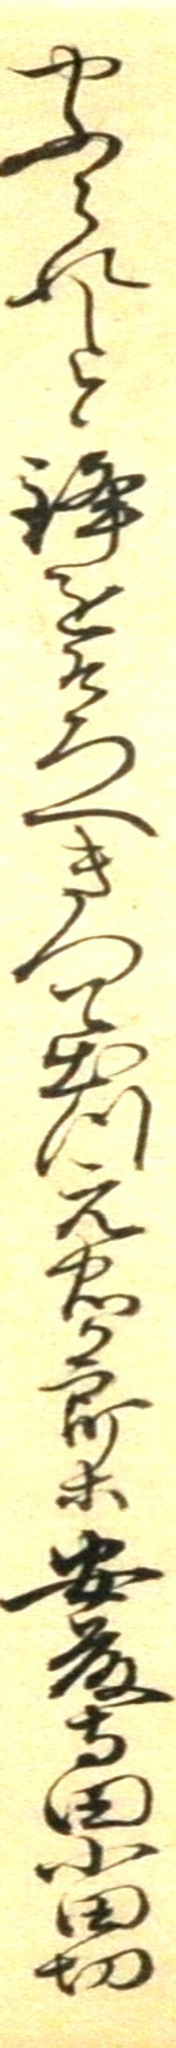やふられしと鋒をそろへきつて出つ元忠か郎等安藤寺田小田切
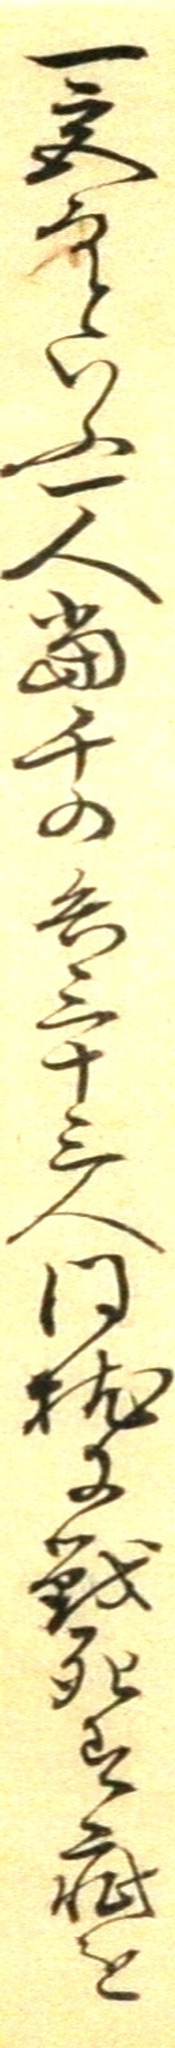一宮なといふ一人当千の兵三十三人同枕に戦死す疵を
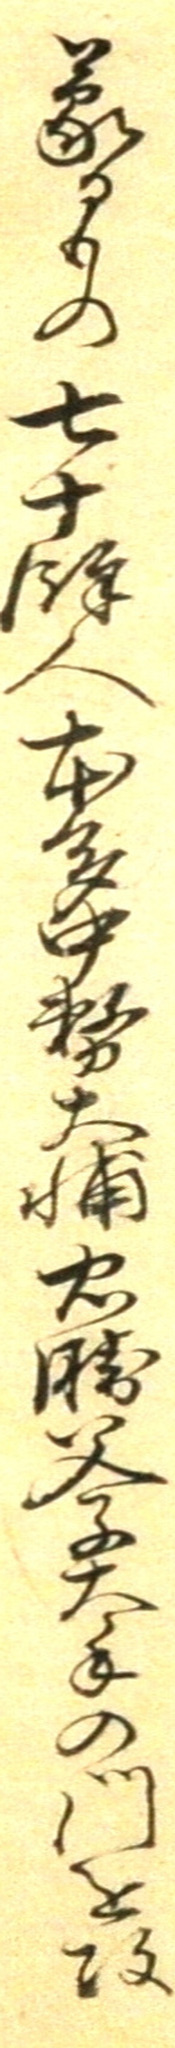蒙るもの七十余人本多中務大輔忠勝父子大手の門を攻
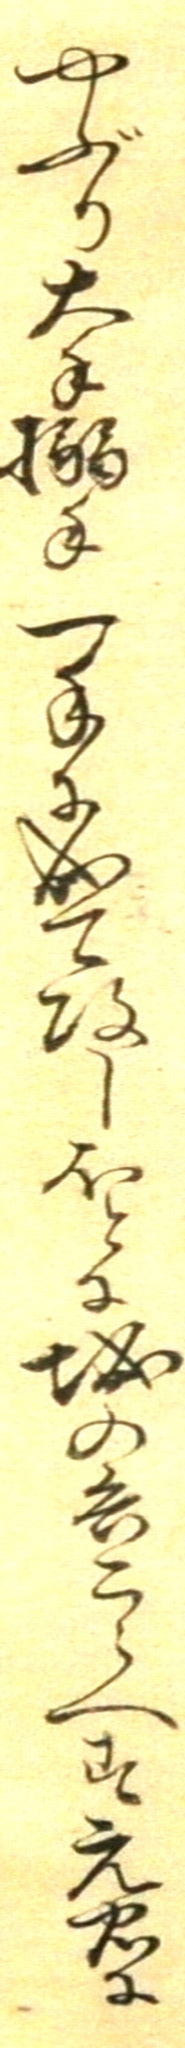やぶり大手搦手一手に成て攻しほとに城の兵こらへす元忠に
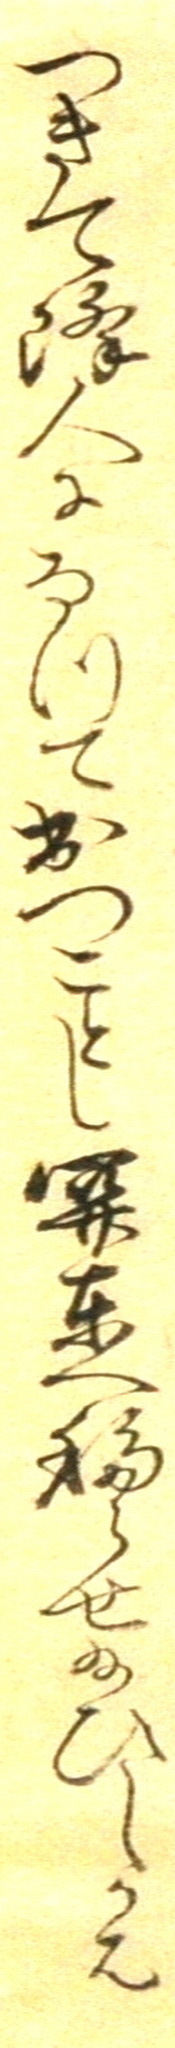つきて降人になつて出つことし関東へ移らせ給ひしかは

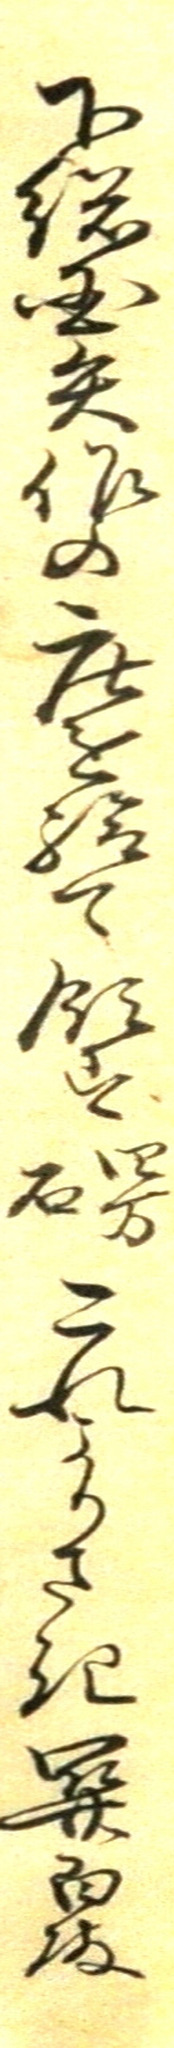下総国矢作の庄を給て領す四万石これよりさき関白殿
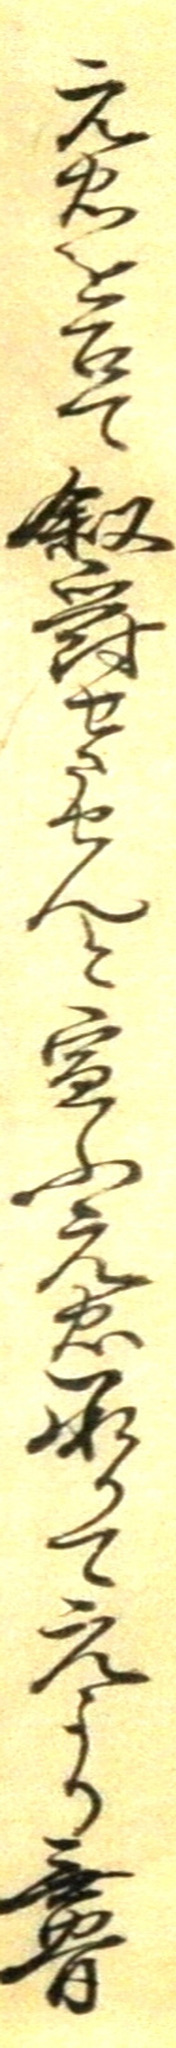元忠を召て叙爵せさせんと宣ふ元忠承りて元より無骨
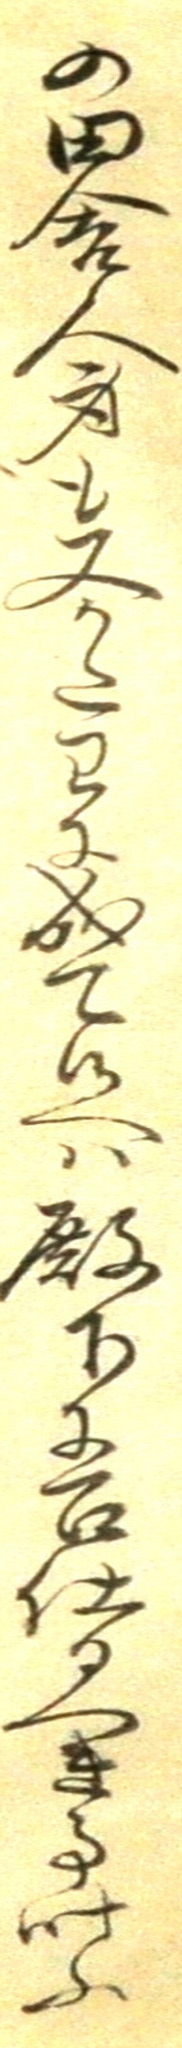の田舎人身も又かたわに成て候へは殿下に召仕るへき事叶ふ
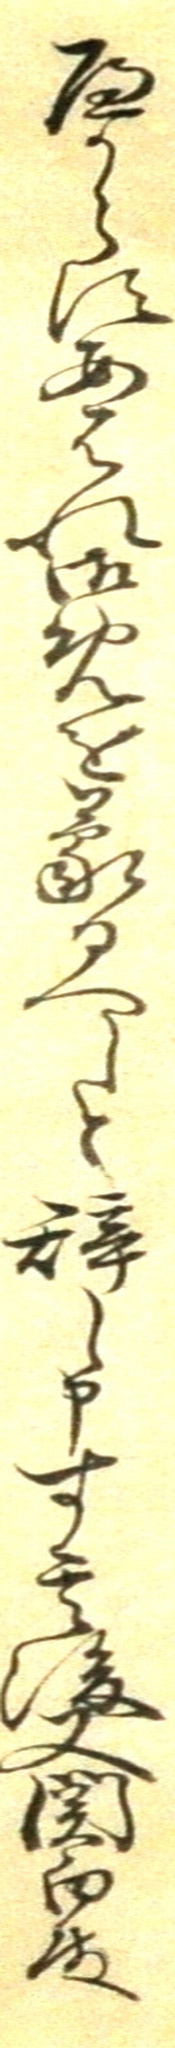へからすあはれ御免を蒙るへしと辞し申す其後関白殿
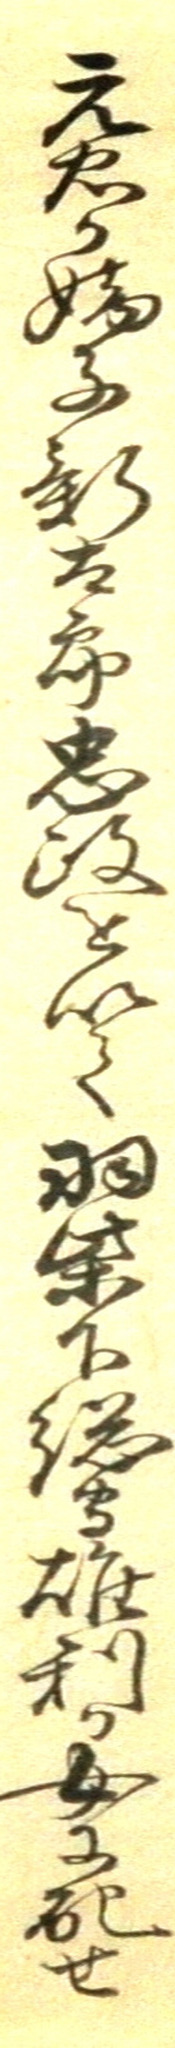元忠か嫡子新太郎忠政を以て羽柴下総守雄利か女に配せ
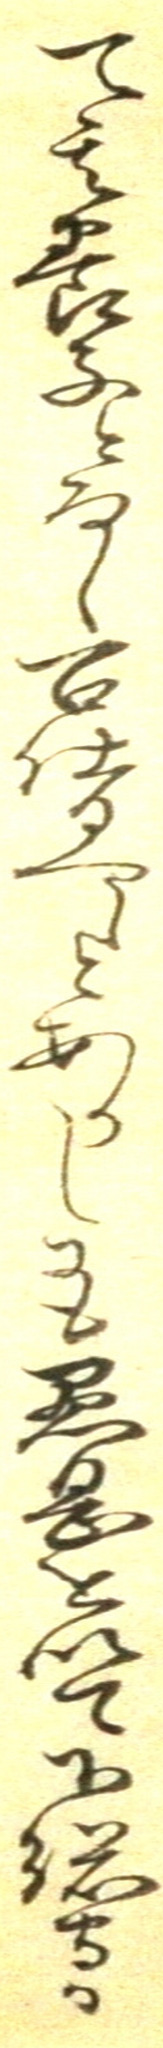て其養子となし召仕るへしとありしにも愚息を以て下総守か
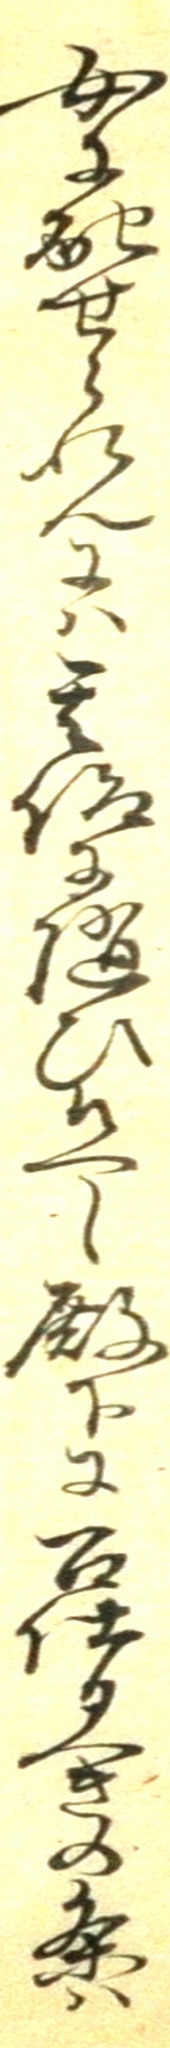女に配せられんには其仰に随ひ候へし殿下に召仕るへきの条は
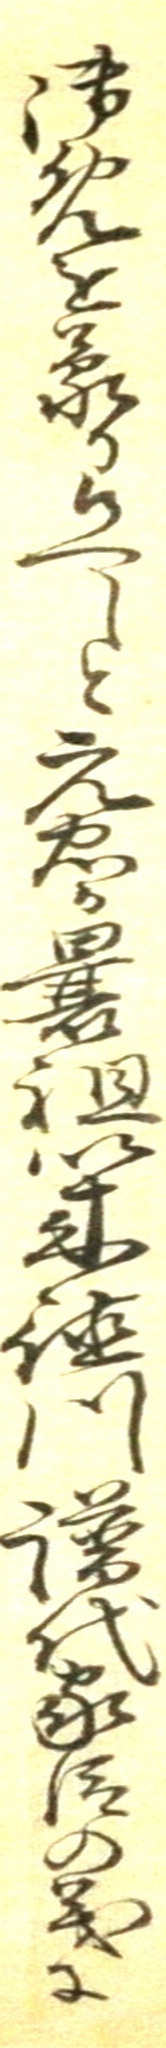御免を蒙り候へしと元忠か曩祖以来徳川譜代家臣の義に
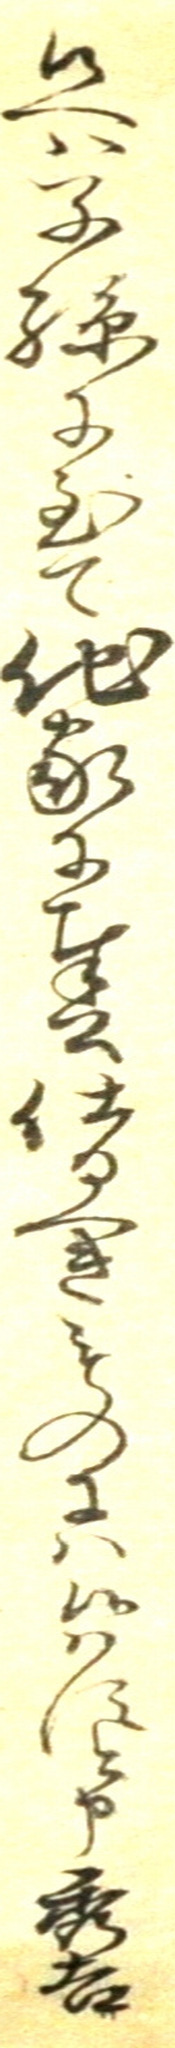候へは子孫に至て他家に奉公仕るへきものには候はすと申秀吉
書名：藩翰譜（四・中）
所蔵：伊那市立高遠町図書館・合同会社AMANE
